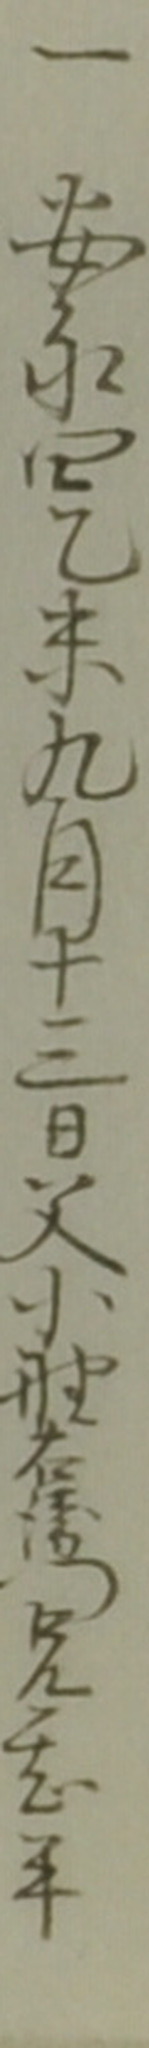一安永四乙未九月十三日父小野右衛門兄甚平
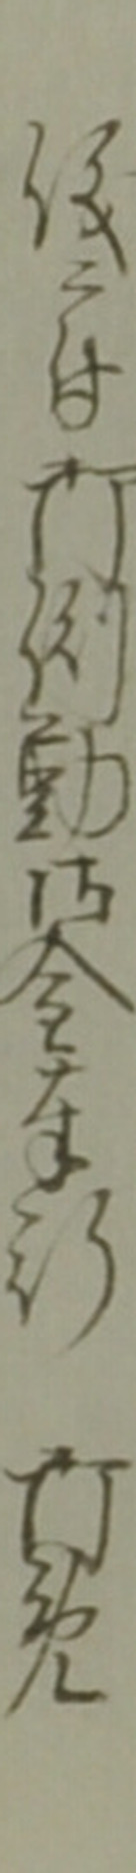儀ニ付御側勤御金奉行御免
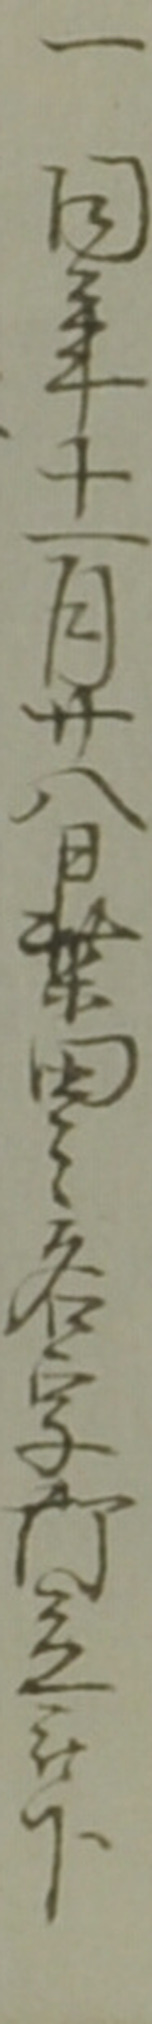一同年十一月廿八日柴田之名字御立被下
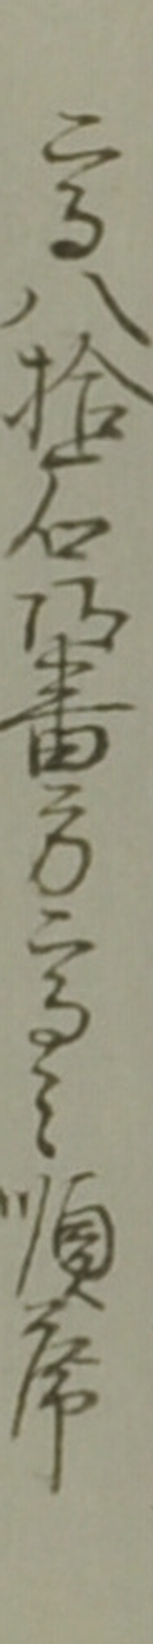高八拾石御番方高之順席
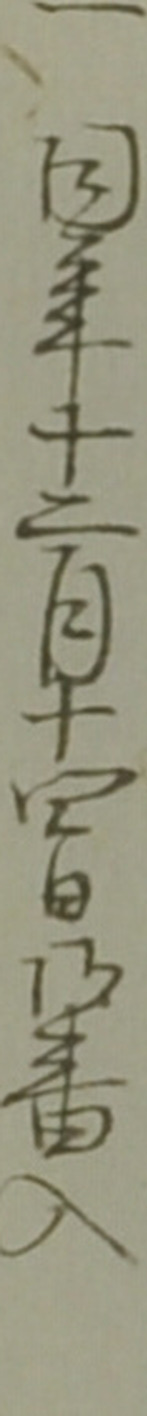一同年十二月十四日御番入
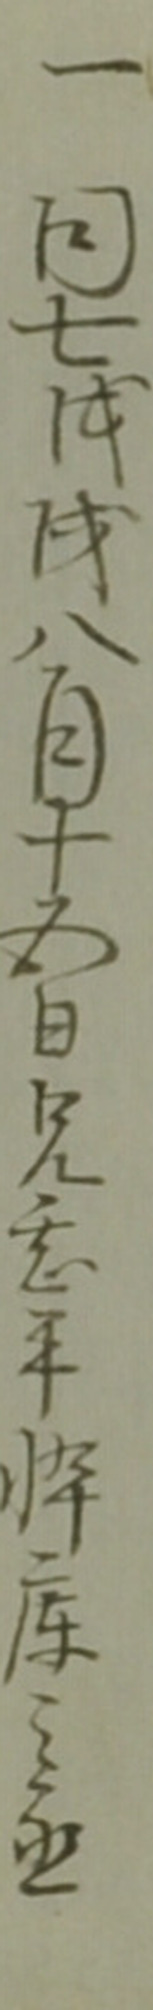一同七戊戌八月十五日兄甚平忰庫之丞
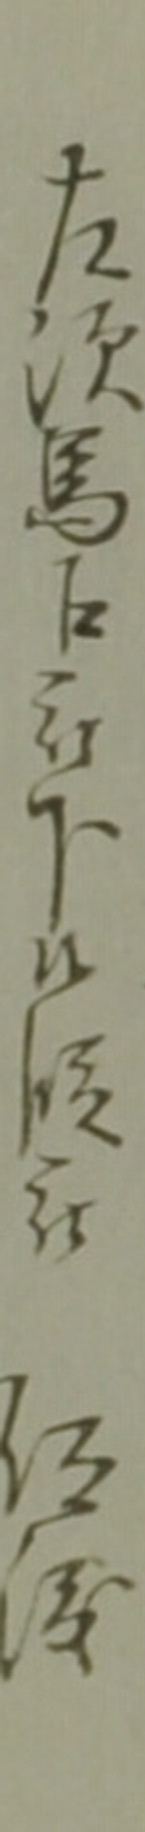左次馬江被下候段被仰渡
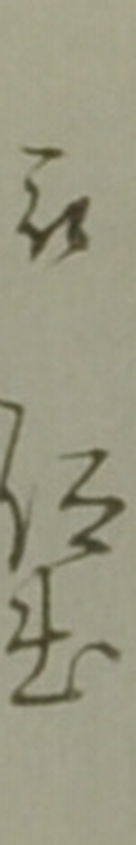被仰出
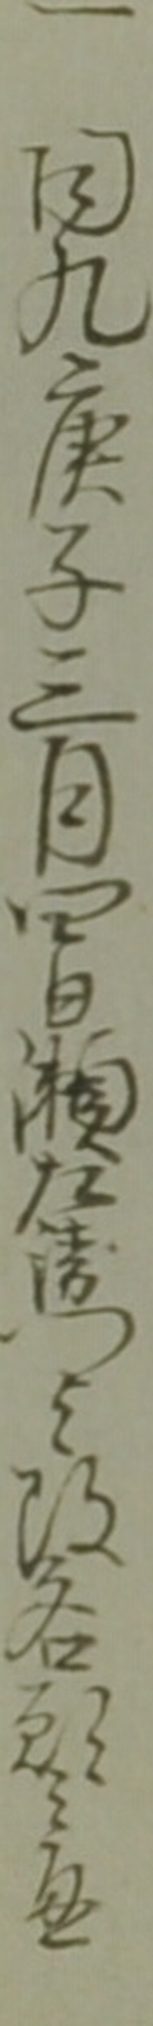一同九庚子三月四日瀬左衛門と改名願之通
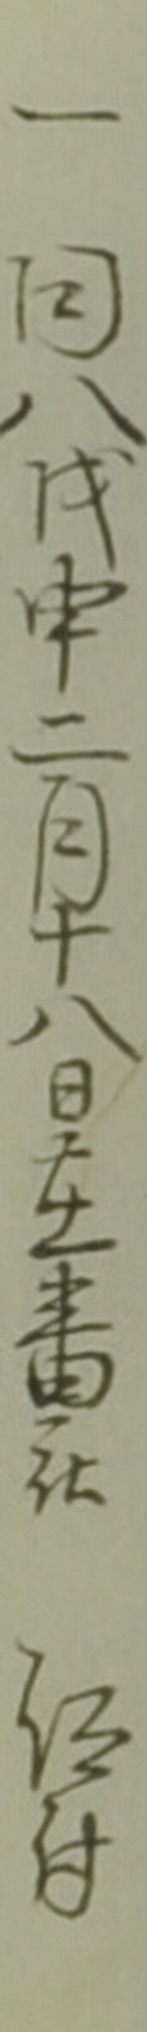一同八戊申二月十八日在番被仰付
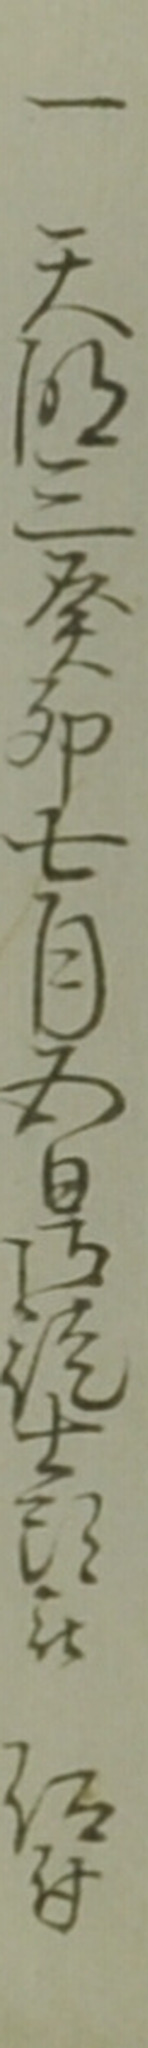一天明三癸卯七月五日御徒士頭被仰付
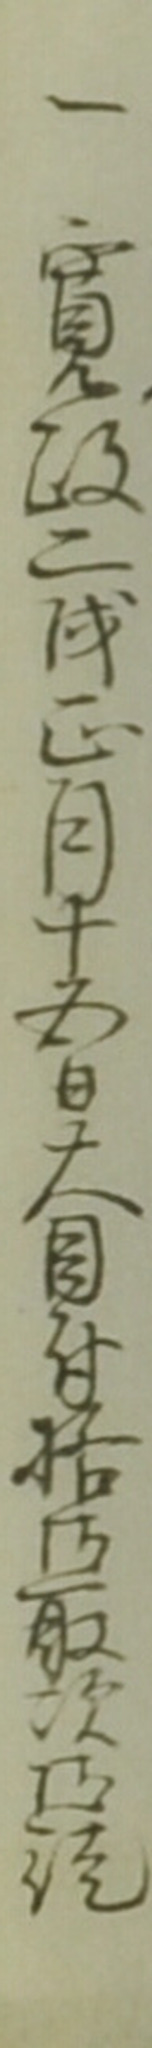一寛政二戌正月十五日大目付格御取次御徒

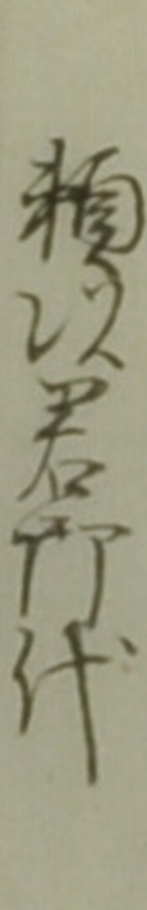頼以君御代
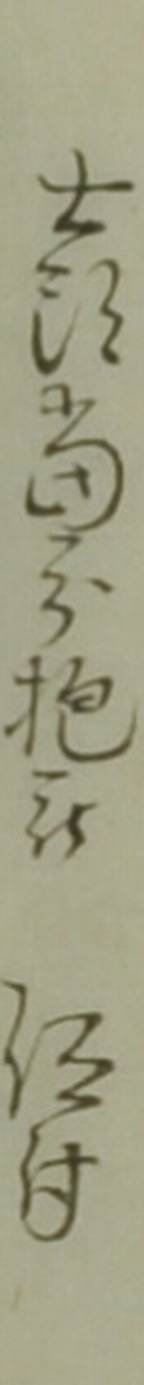士頭当分抱被仰付
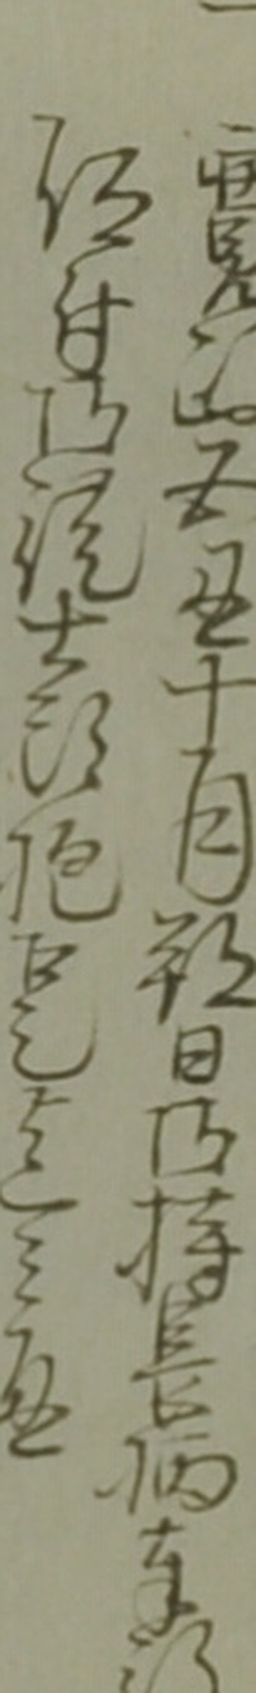仰付御徒士頭抱是迄之通
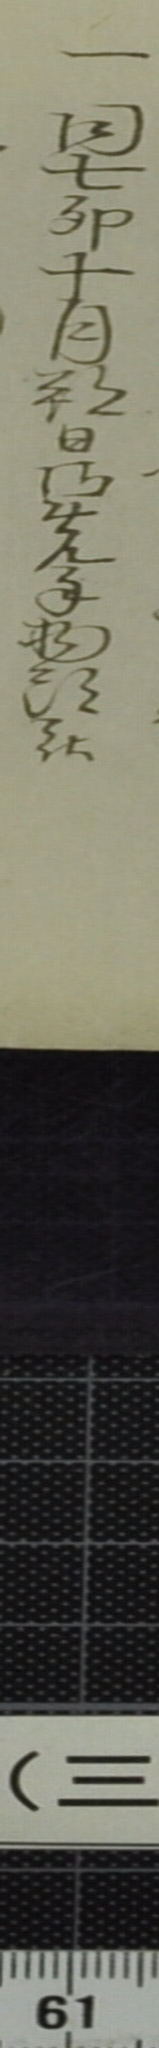一同七卯十月朔日御先手物頭被
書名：給人諸士勤仕録（三）
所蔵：伊那市立高遠町図書館・合同会社AMANE
